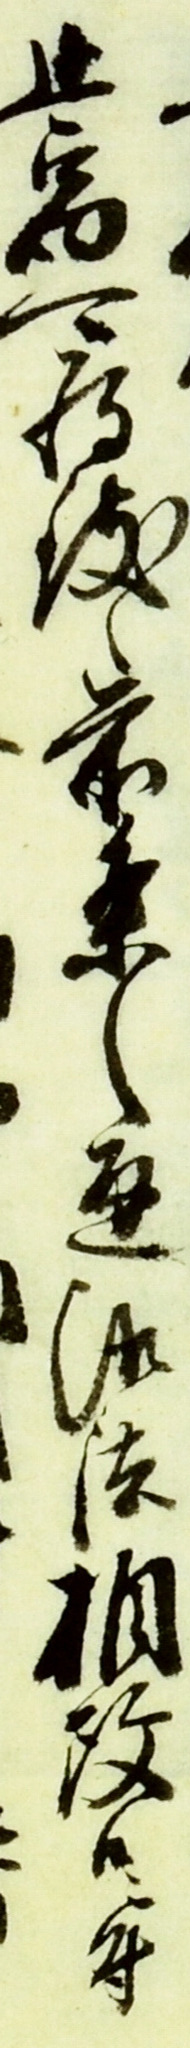止宿可為致候前条之通趣法相改候ニ付
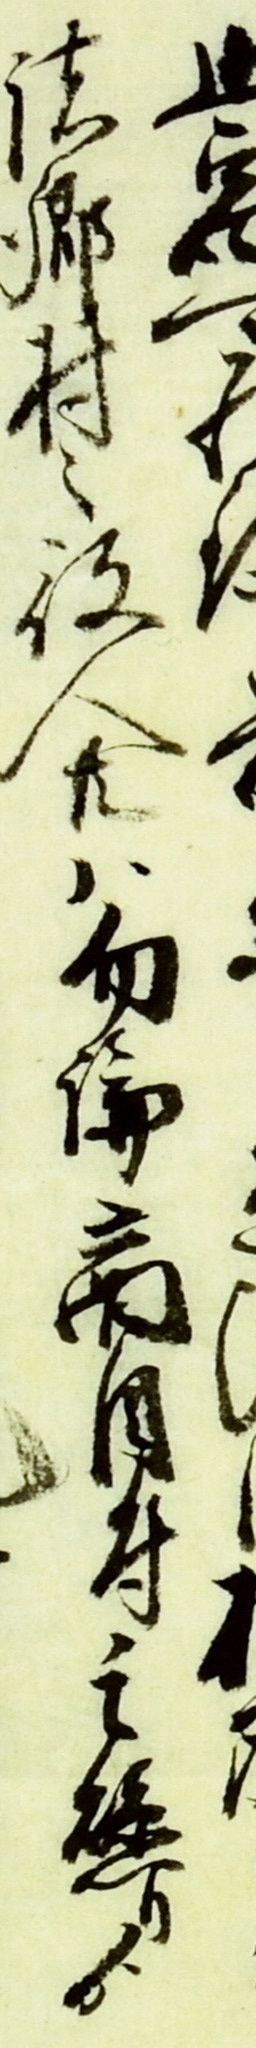諸郷村々役人共ハ勿論商目付之懸りゟ
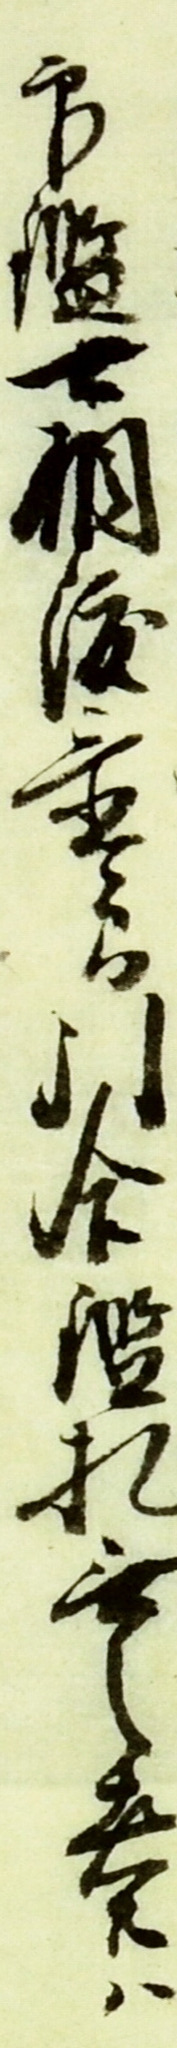印鑑可相渡置候間引合鑑札無之者共ハ
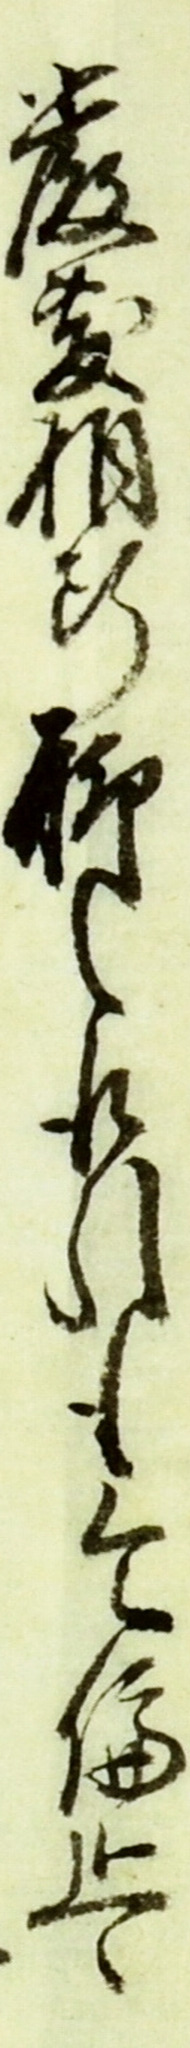厳敷相断聊之取引も令偏止候
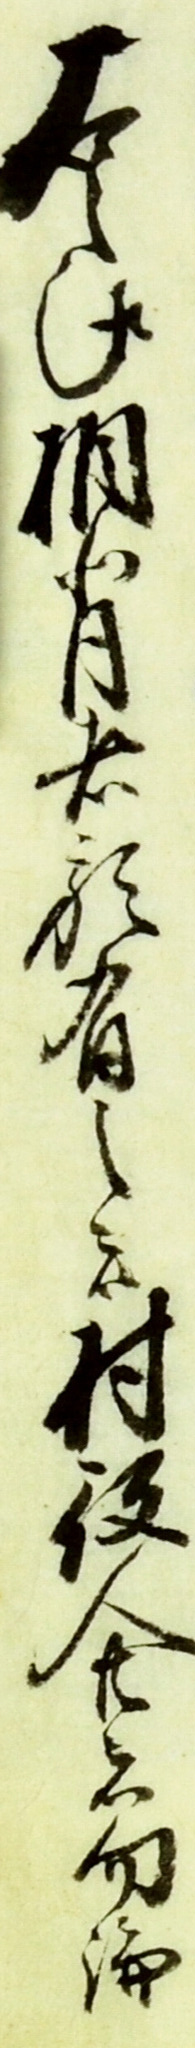右之趣相背者於有之者村役人共者勿論

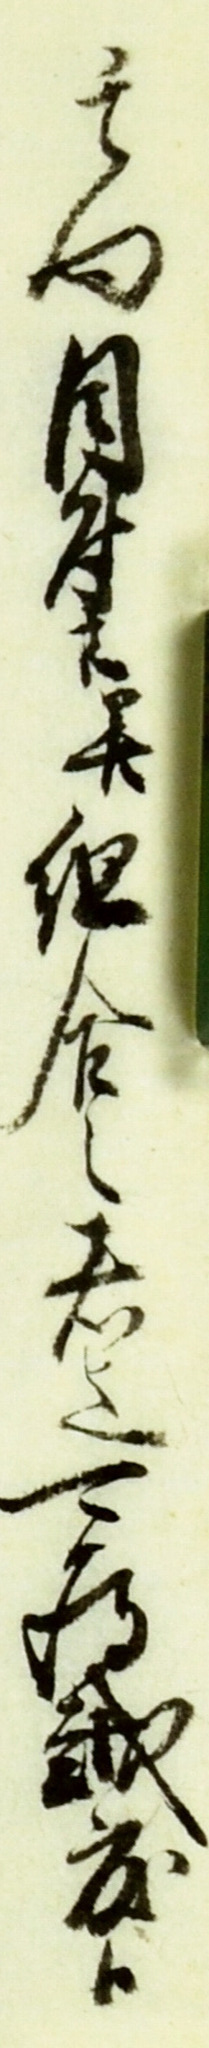其向目付共并組合之者迄可為越度候
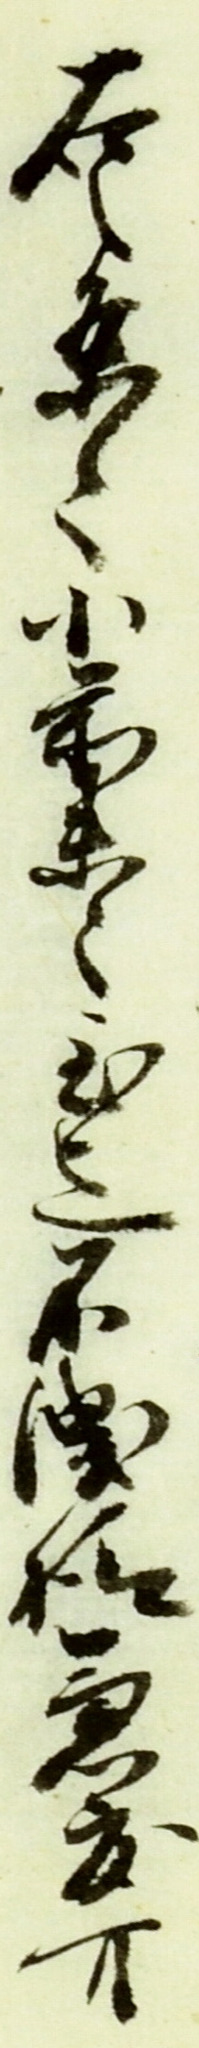右之条々小前末々至迄不洩様急度可
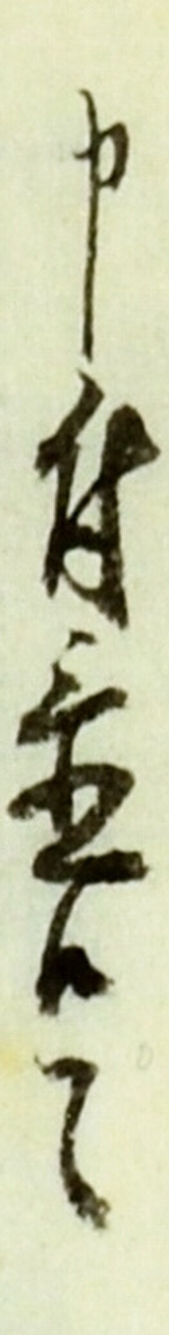申付置候以上
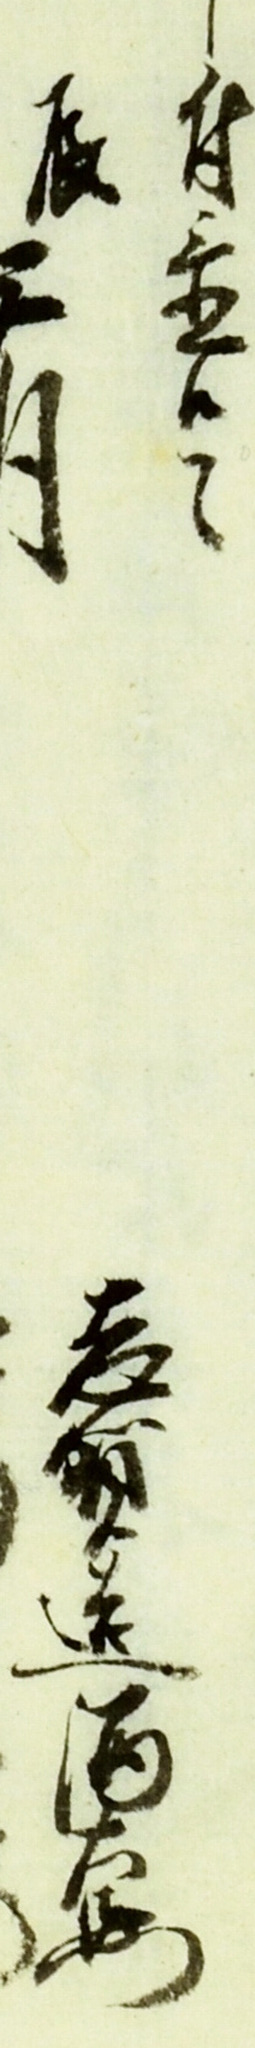辰五月志賀造酒右衛門
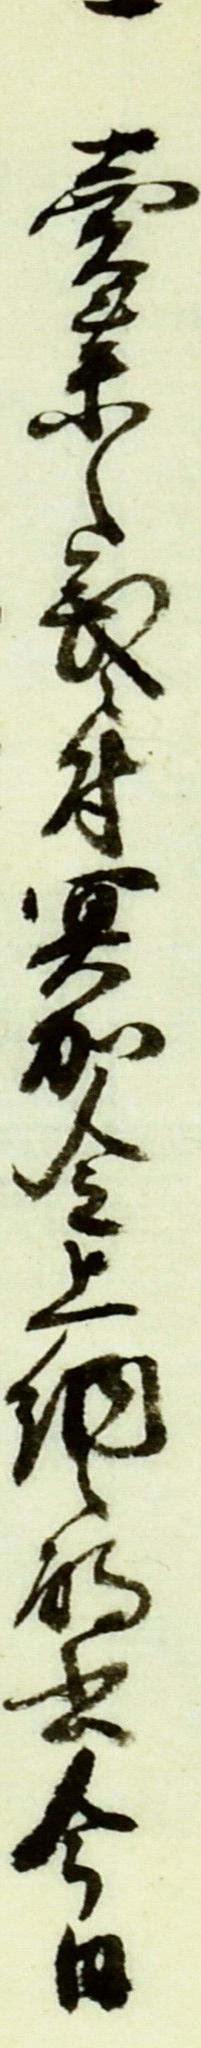一売薬之義ニ付冥加金上納之触書今日
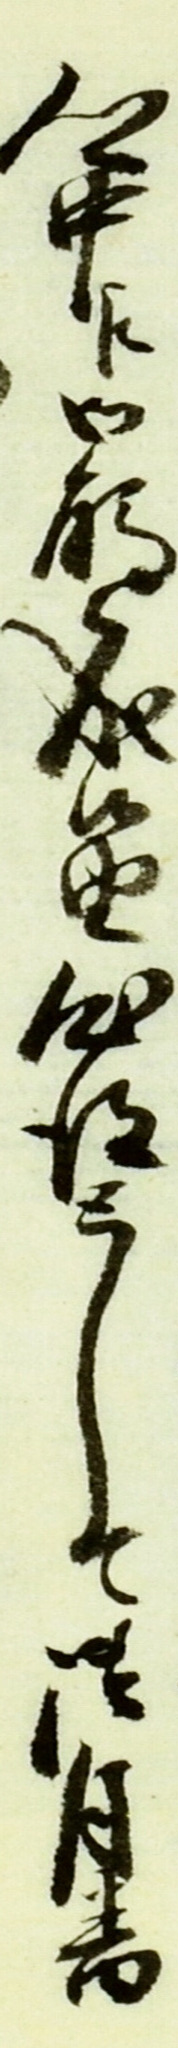郷中江御触被成候由心得として御月番
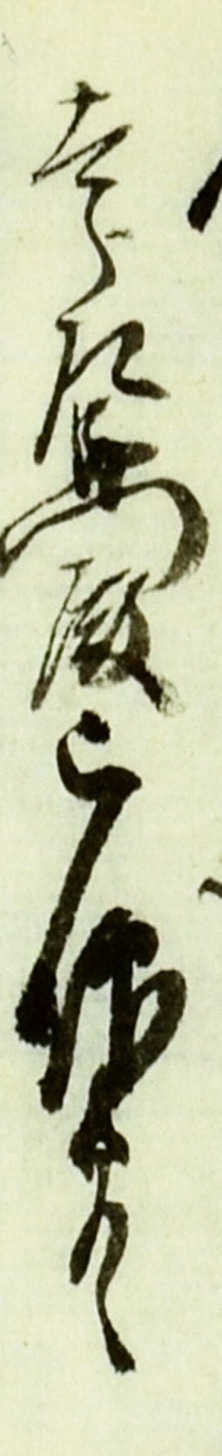太郎左衛門殿被仰聞候
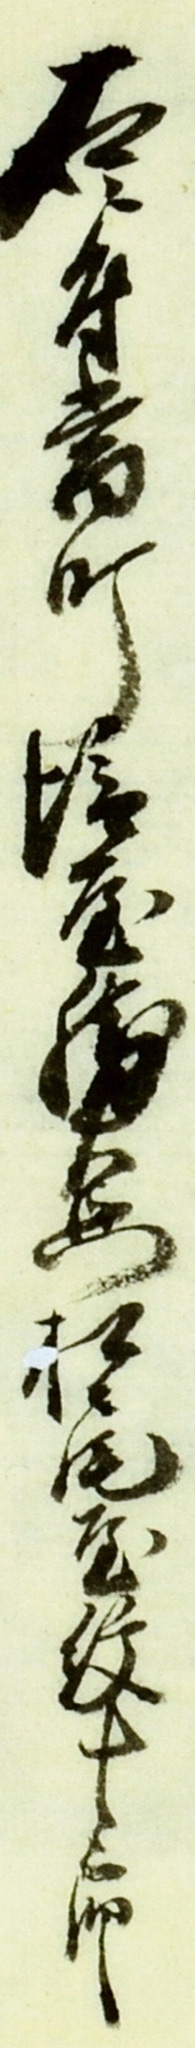右ニ付当町塩屋勝右衛門松尾屋紋十郎
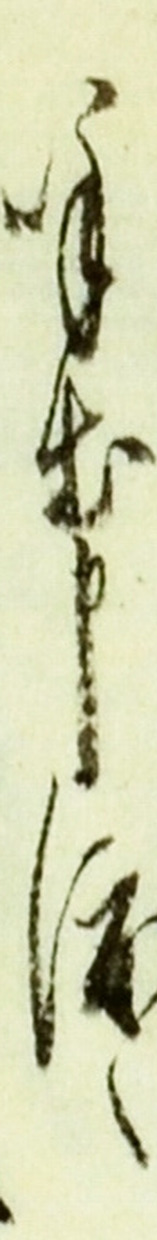呼出申添候
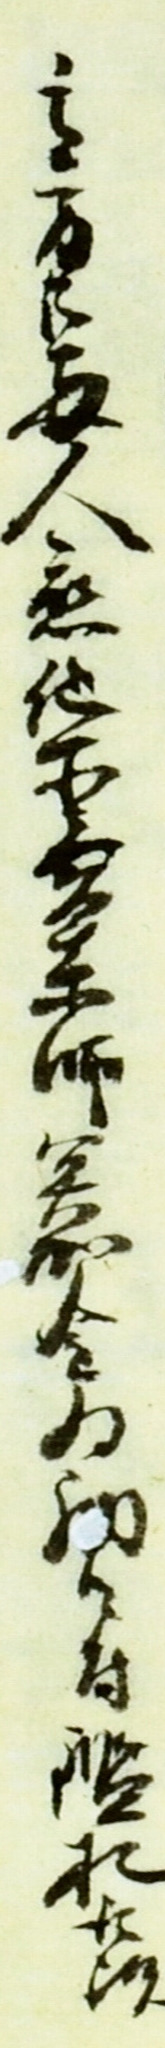其方共両人愈他所売薬師冥加金為納候ニ付鑑札取次
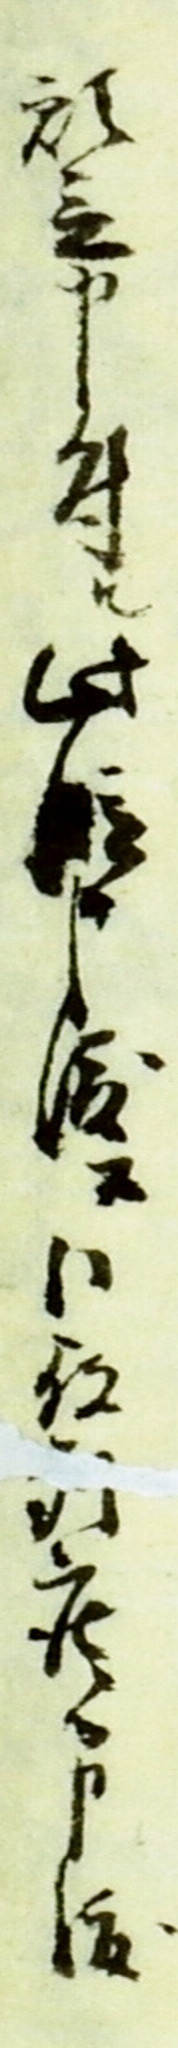願立申付候此段申渡候同役列座ニ而申渡
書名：他国賣薬師運上之事
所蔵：伊那市立高遠町図書館・合同会社AMANE
